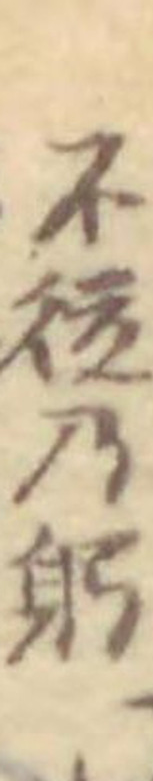不従乃躬
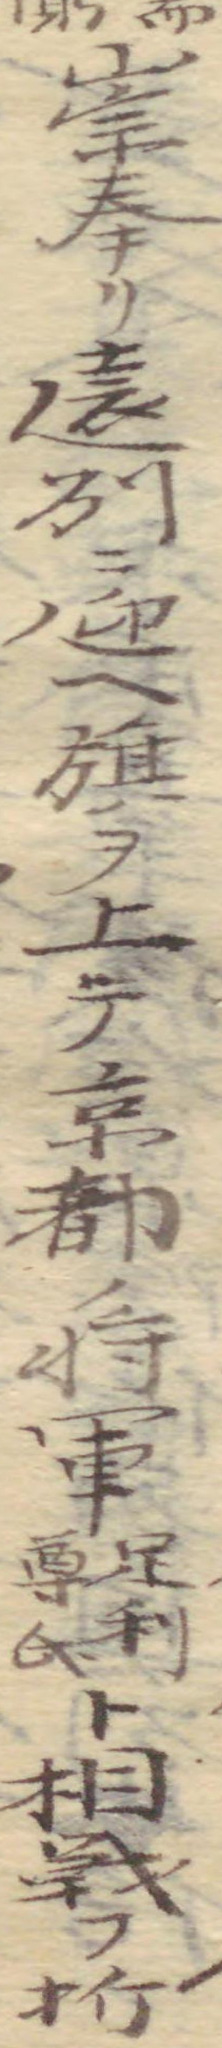崇奉リ遠州ニ迎へ旗ヲ上テ京都ノ将軍足利尊氏ト相戦フ折
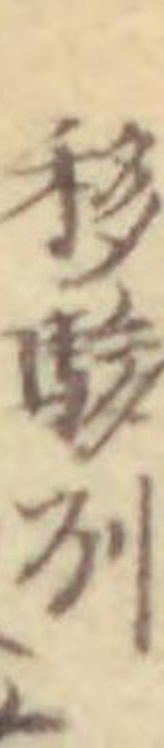移駿州
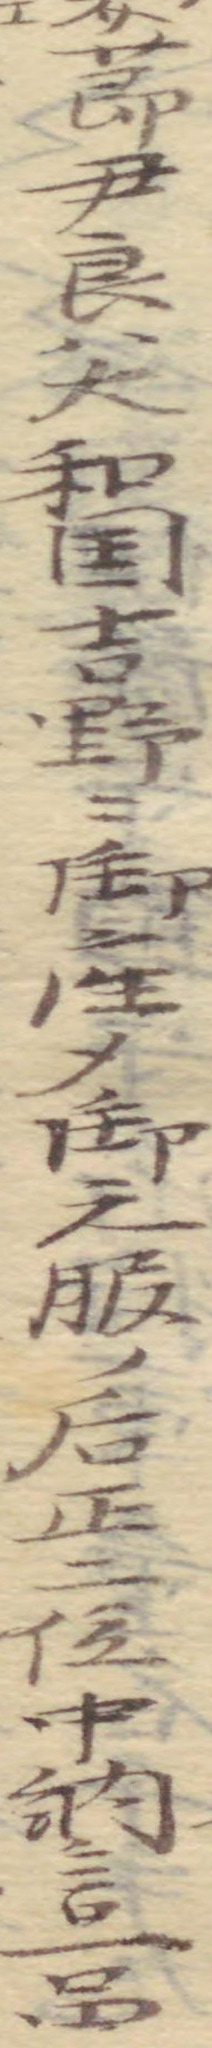節尹良ハ大和国吉野ニ御座シテ御元服ノ后正二位中納言一品
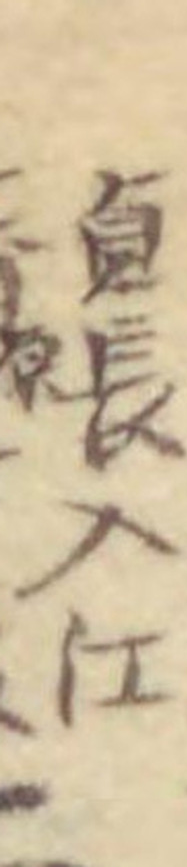貞長入江
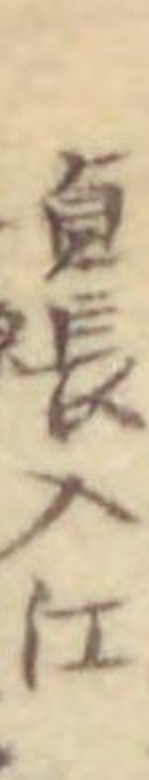貞長入江
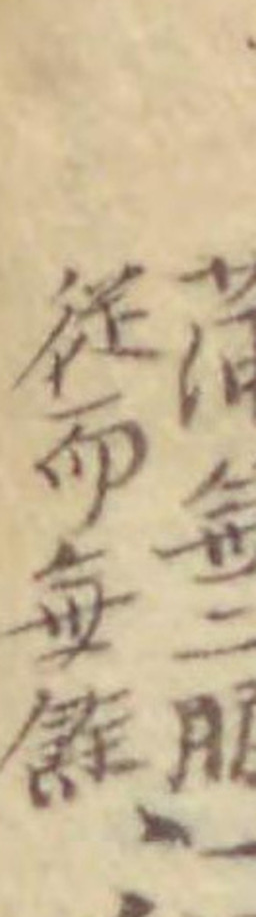従而無餘
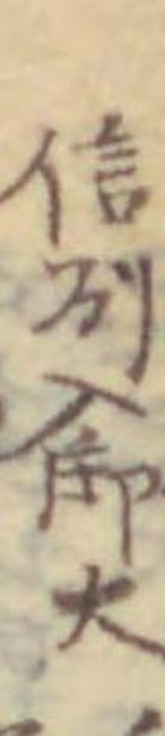信州入御大
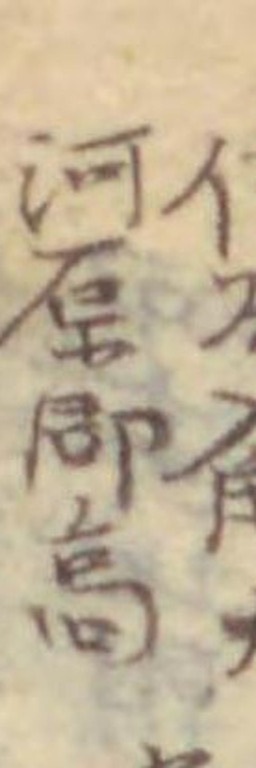河原郡高
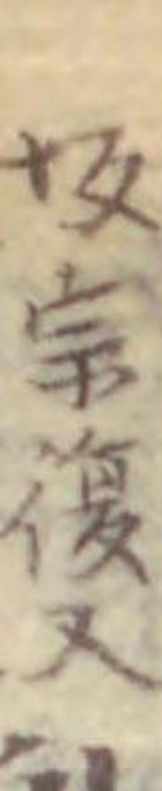坂宗復又
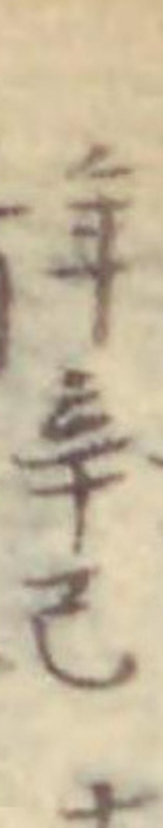年辛巳
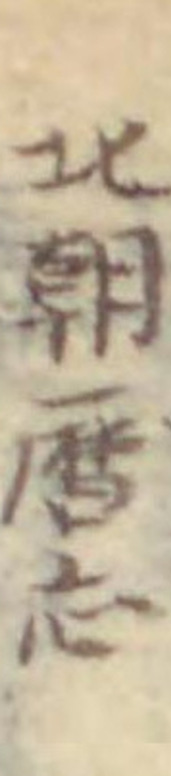北朝暦応
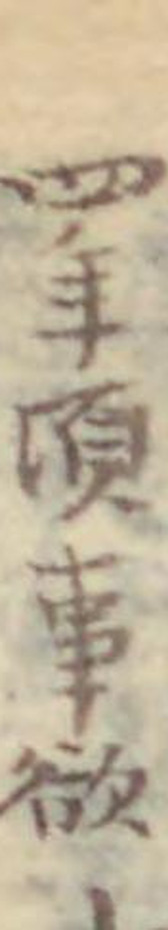四年頃事欲
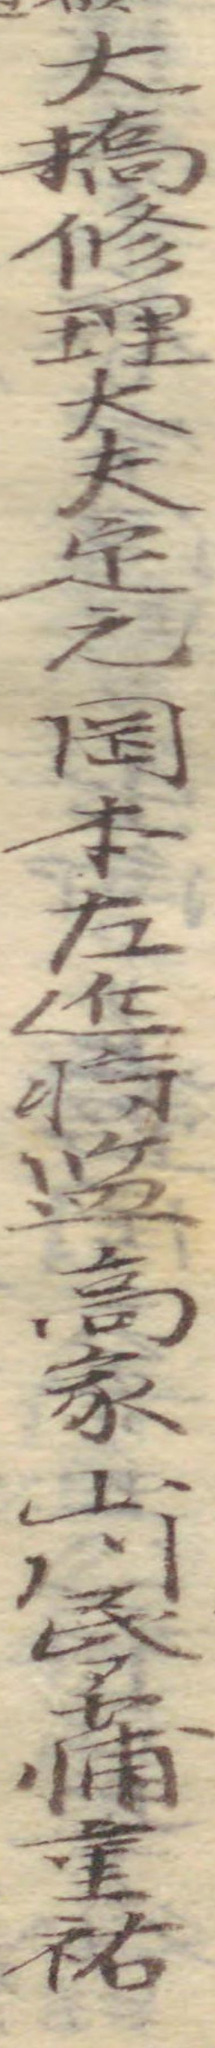大橋修理大夫定元岡本左近将監高家山川民部少輔重祐
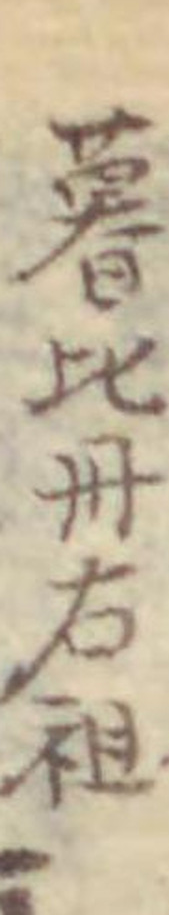暮頃丹右祖
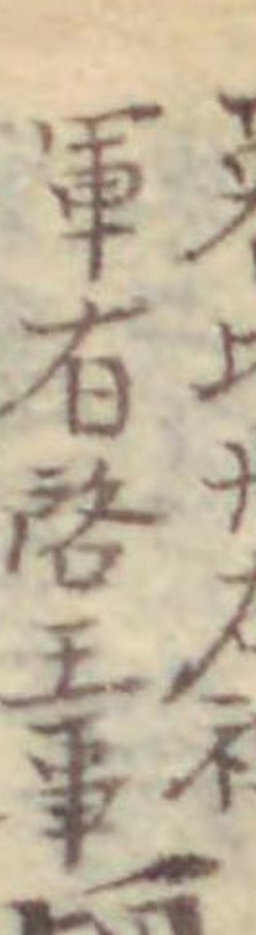軍有啓王事
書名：鶯宿雑記. 巻199-200
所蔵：国立国会図書館 National Diet Library, JAPAN
